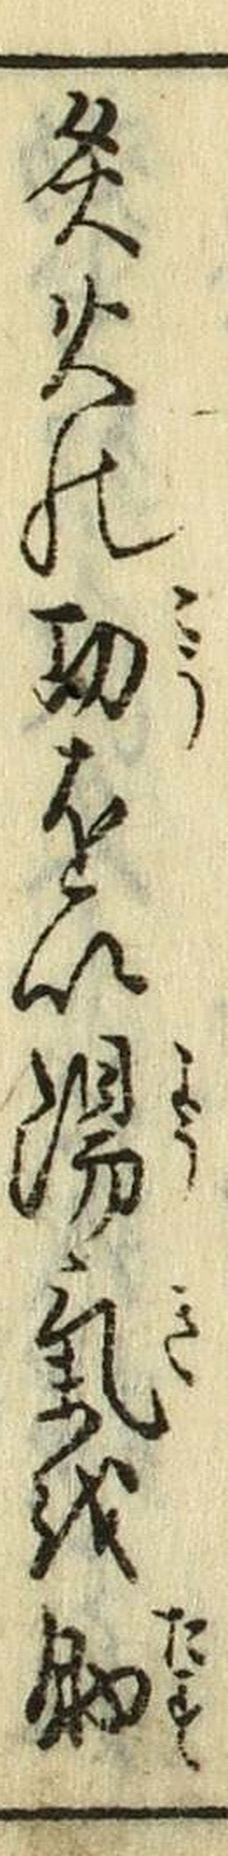灸火の功を以陽気を助
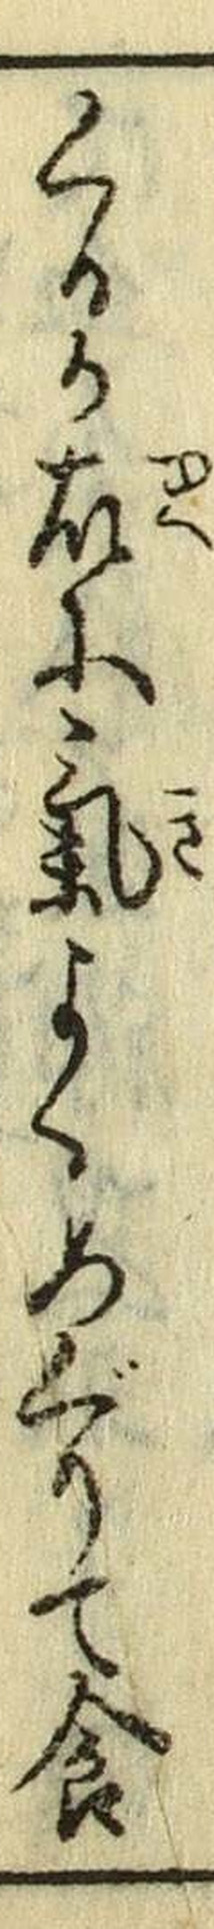くるか故に気よくめぐりて食
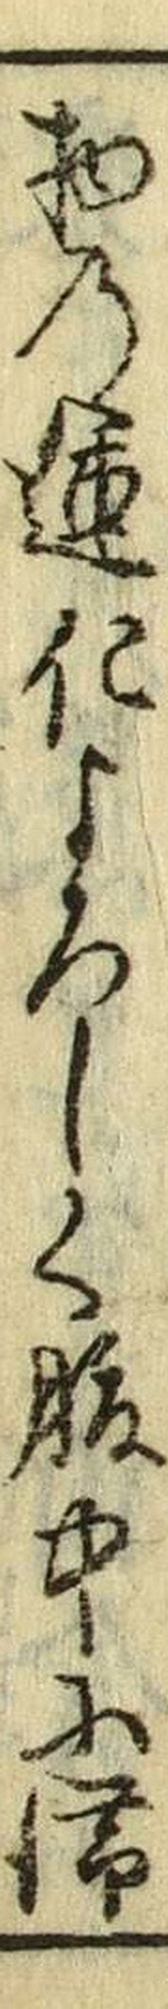物の運化よろしく腹中に滞

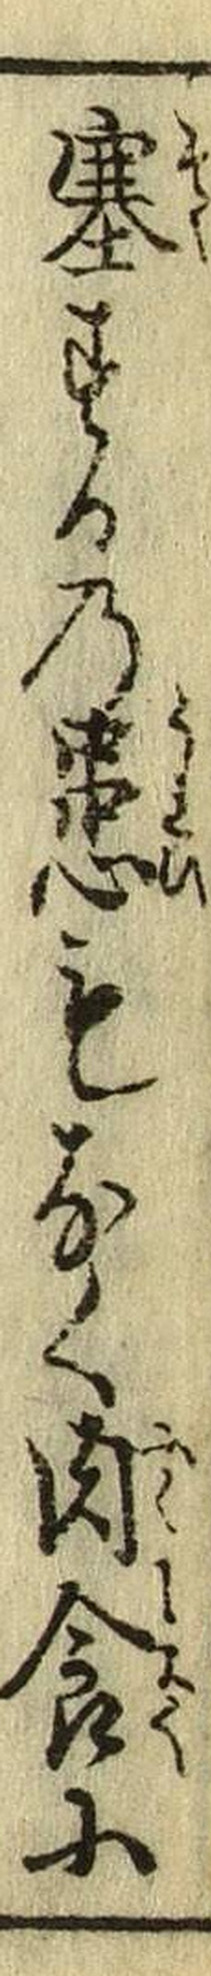塞するの患もなく肉食に
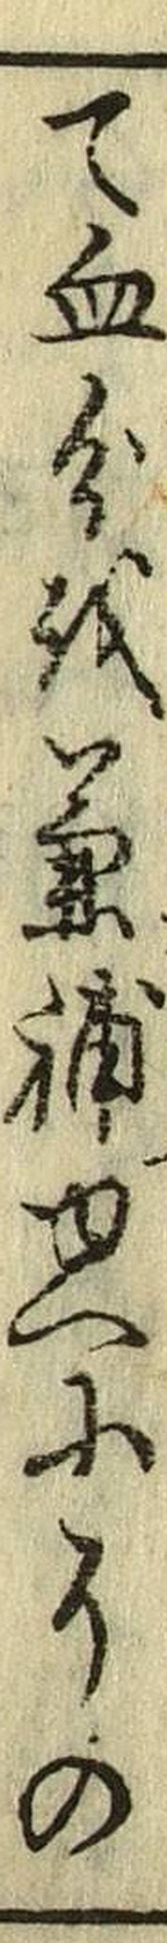て血分を兼補ゆへにその
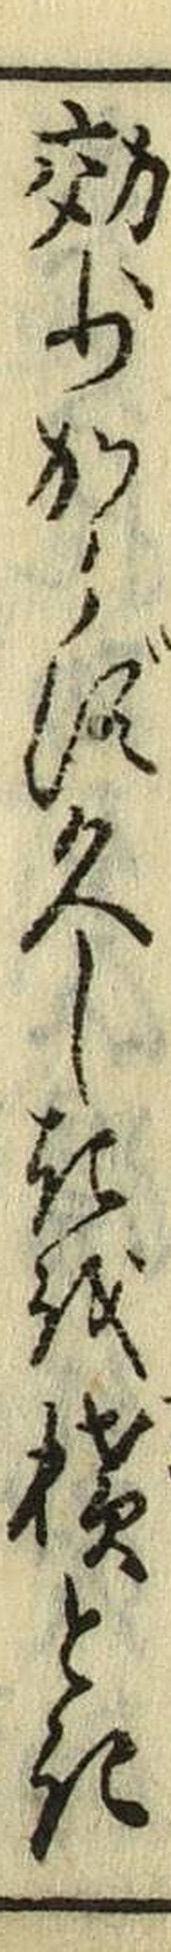効少からず久しきを積とき
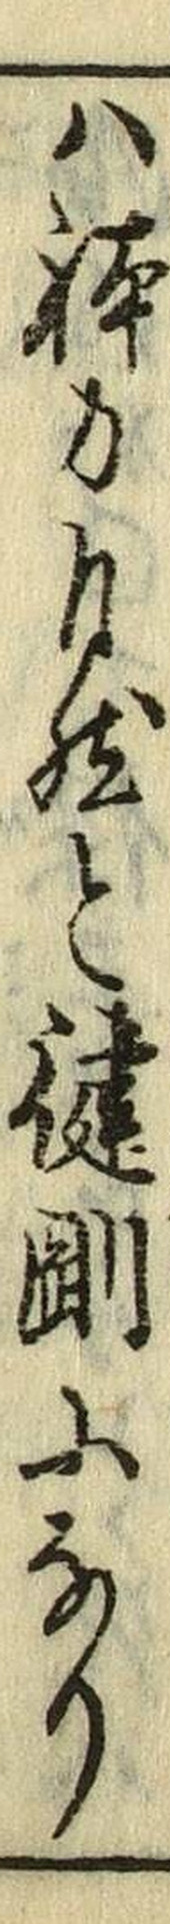は体力自然と健剛になり
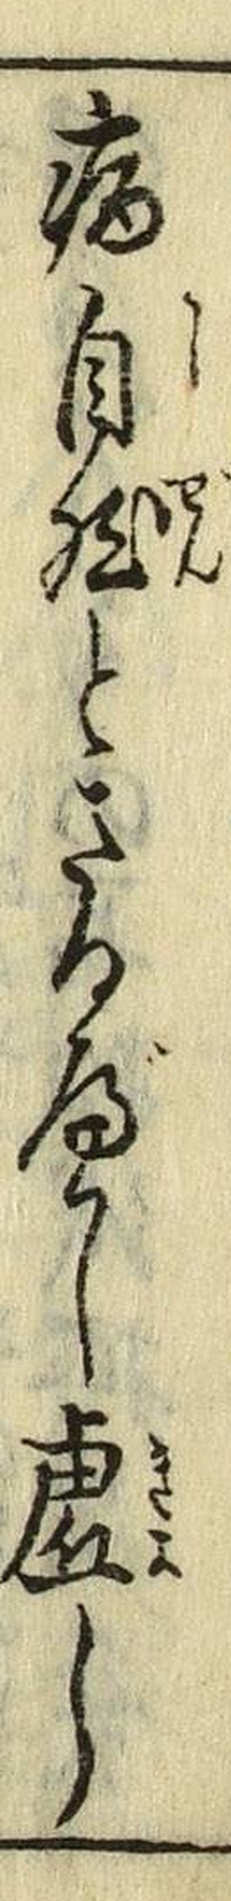病自然とさるべし虚し
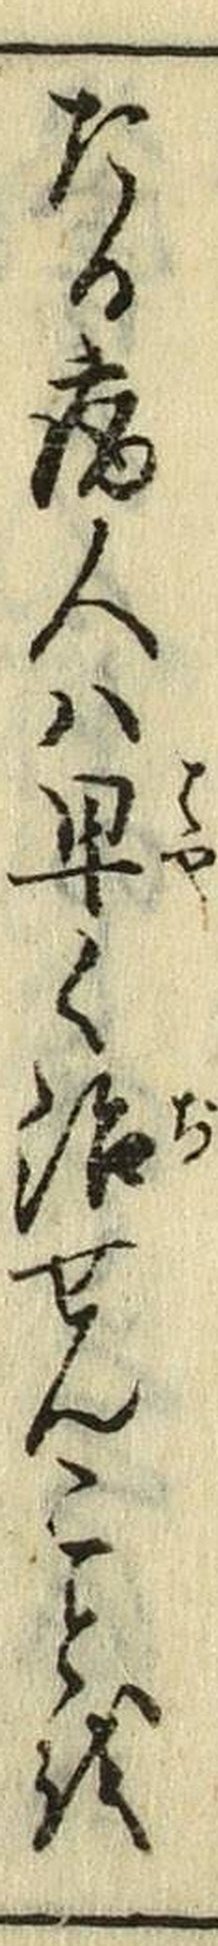たる病人は早く治せんことを
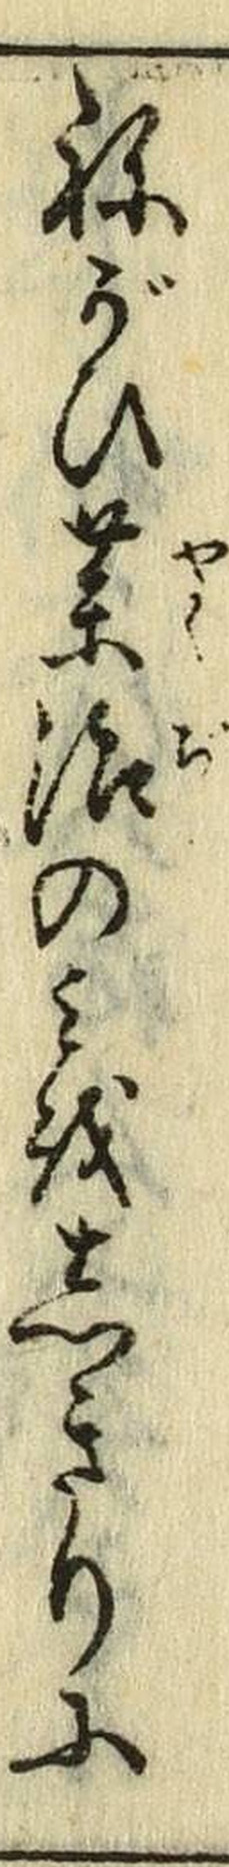ねがひ薬治のみをしきりに
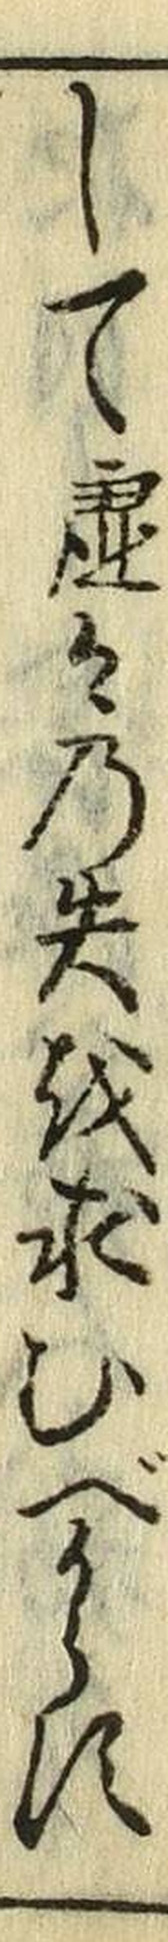して虚々の失を求むべからす
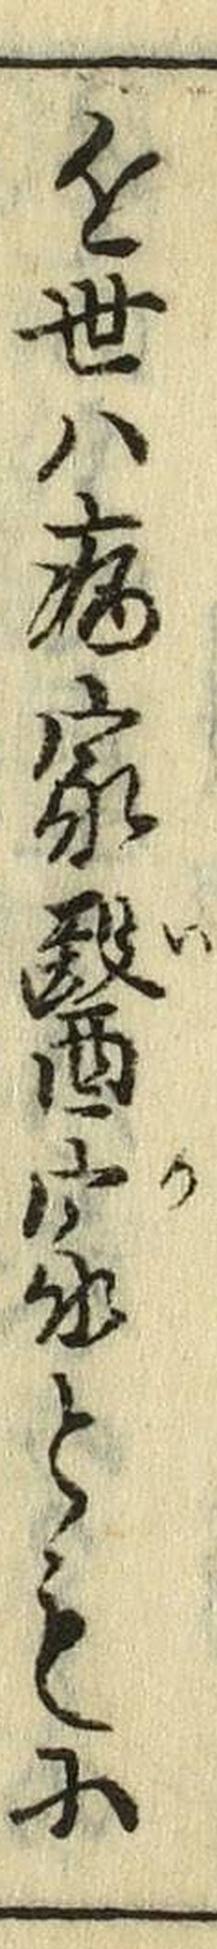近世は病家医家ともに
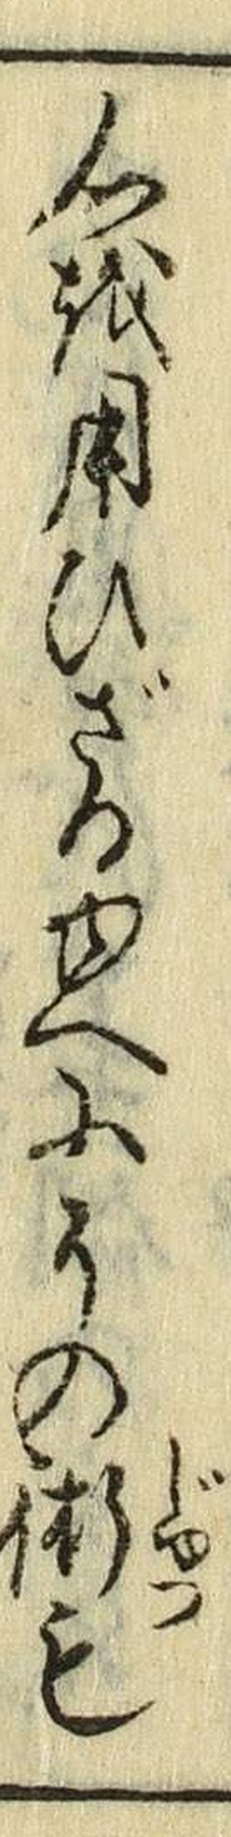心を用ひざるゆへにその術も
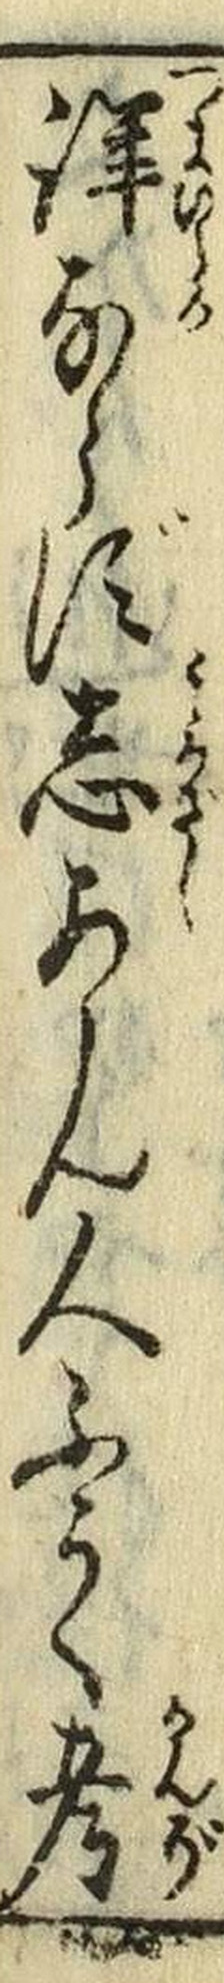詳ならず志あらん人ふかく考
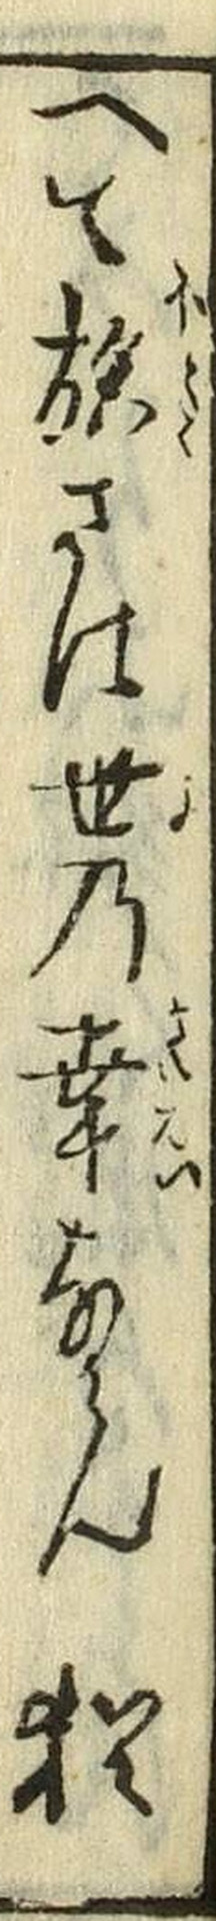へて施さは世の幸ならん猶
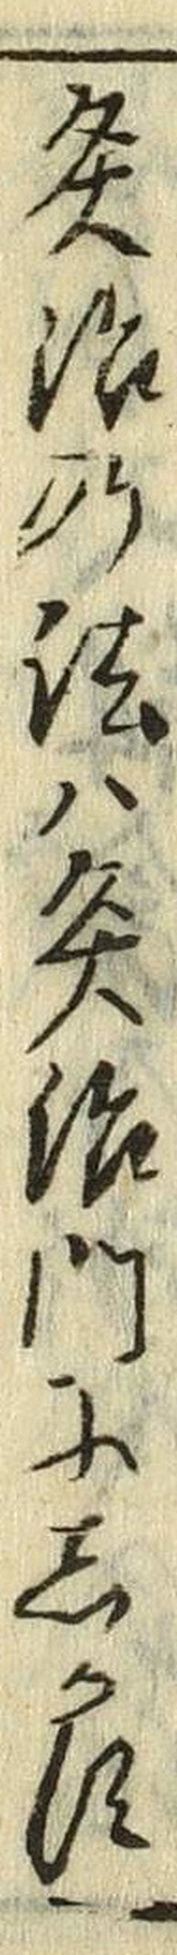灸治の法は灸治門にしかす
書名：居家養生記
